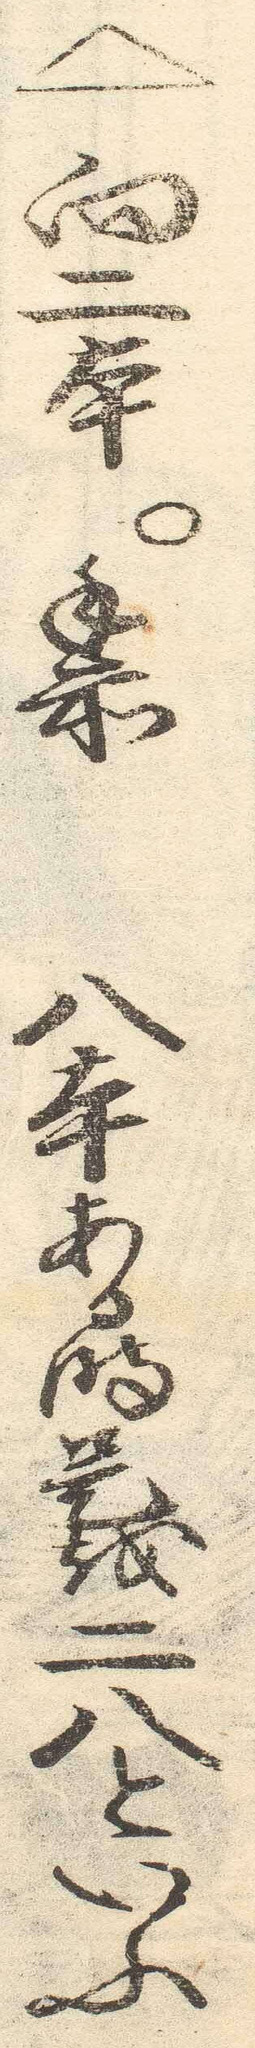△向二本手前八本ある時是を二八といふ
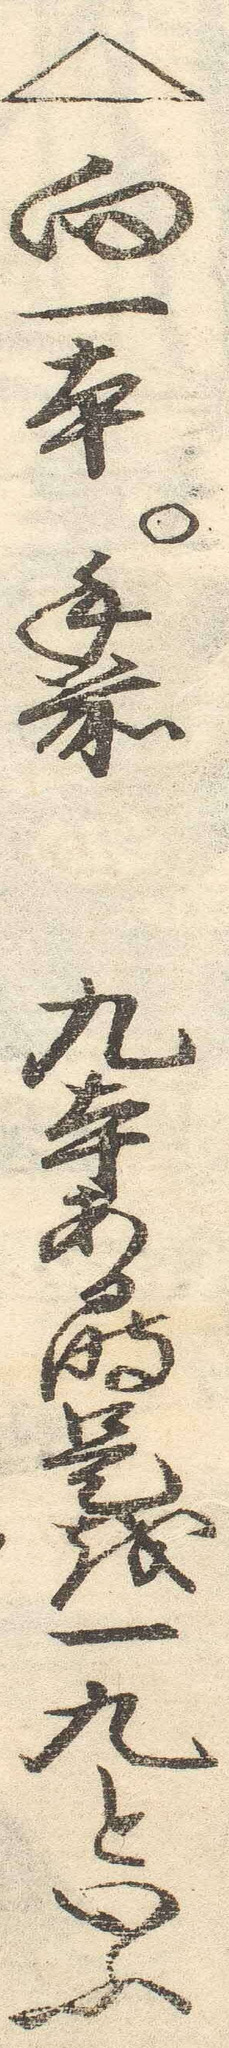△向一本手前九本ある時是を一九といふ
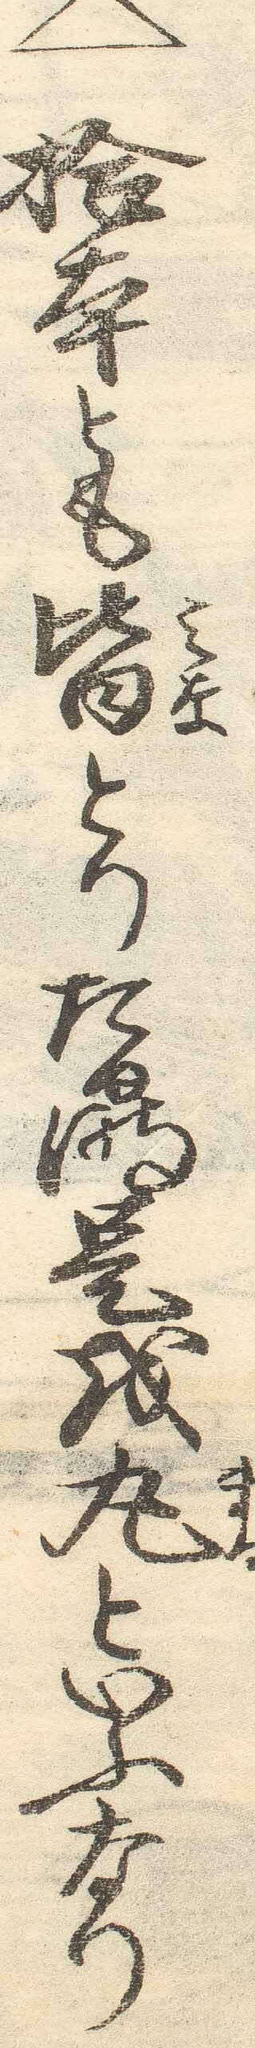△拾本とも皆とりたる時是を丸といふなり
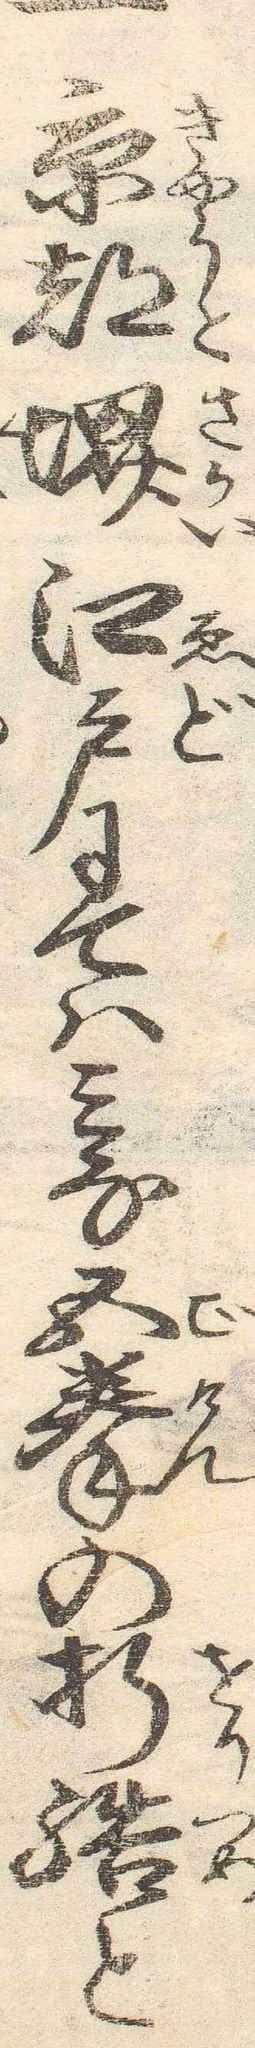一京都堺江戸にてはみな五拳の折詰と
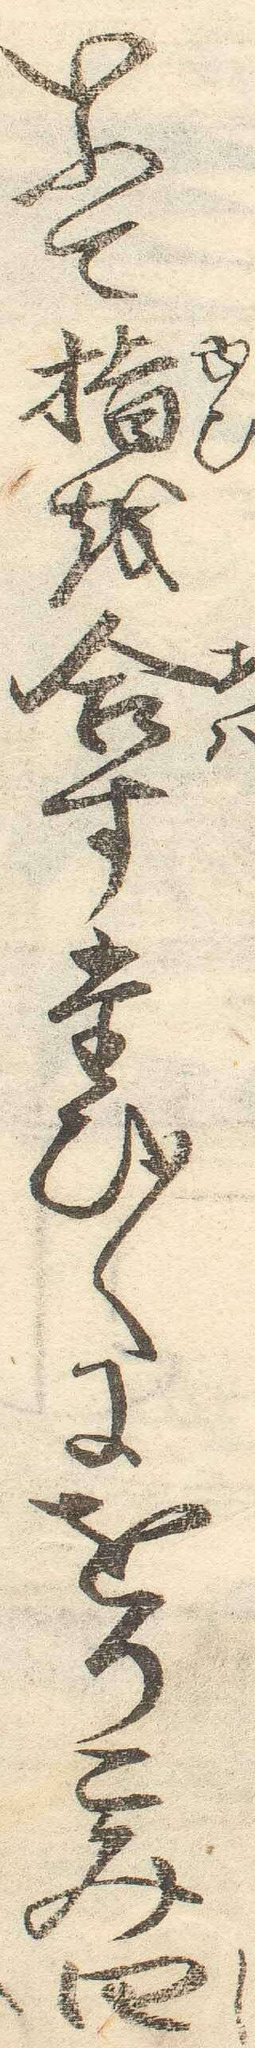いふて指を合すたひ〳〵にをりこみ四
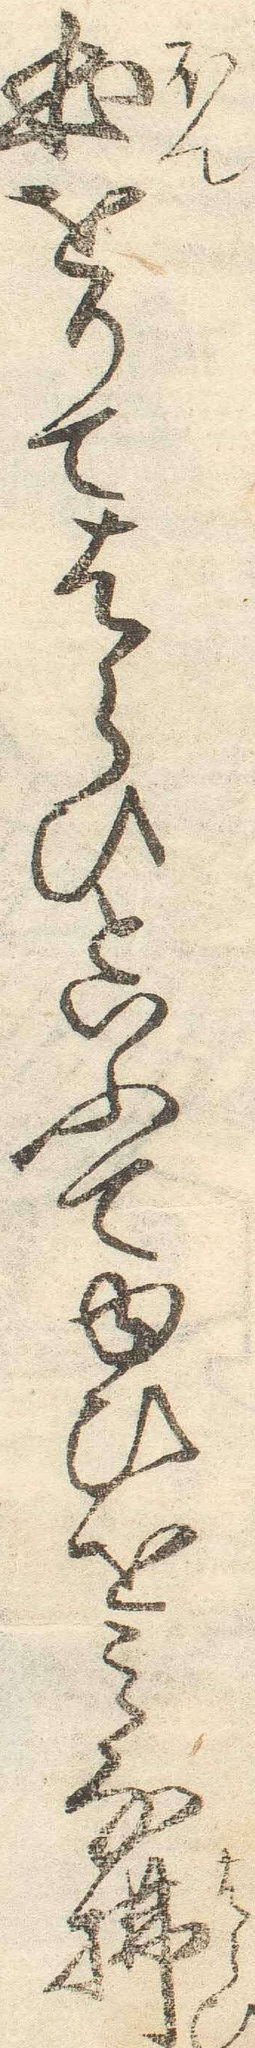本をりてはらひといふてゆひをみな払
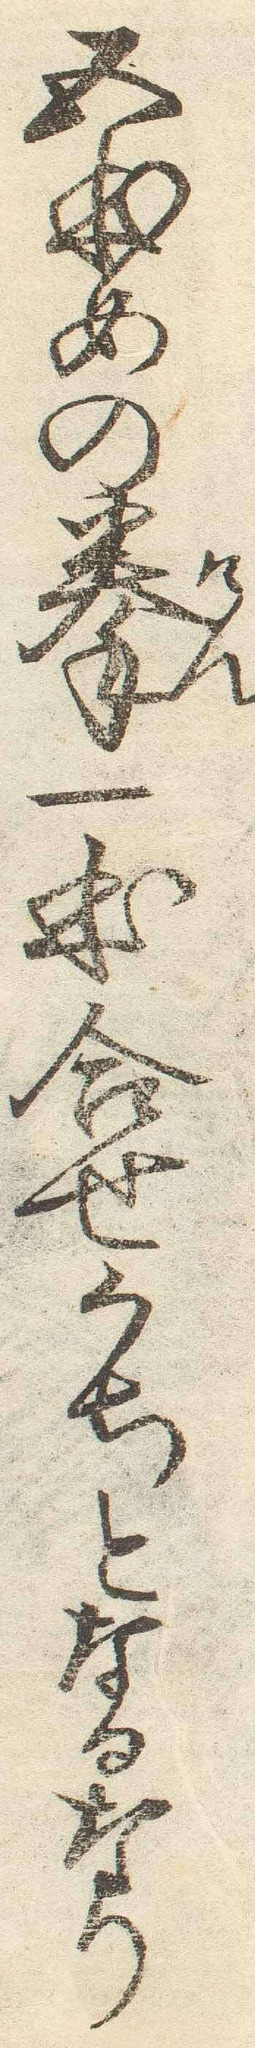五本めの拳一本合せかちとなるなり

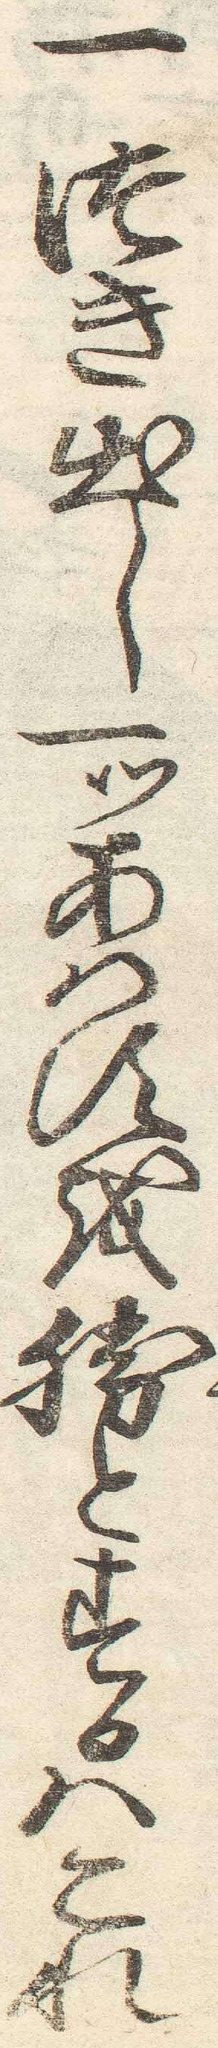一つき出し一ッあはすを勝とするはこれ
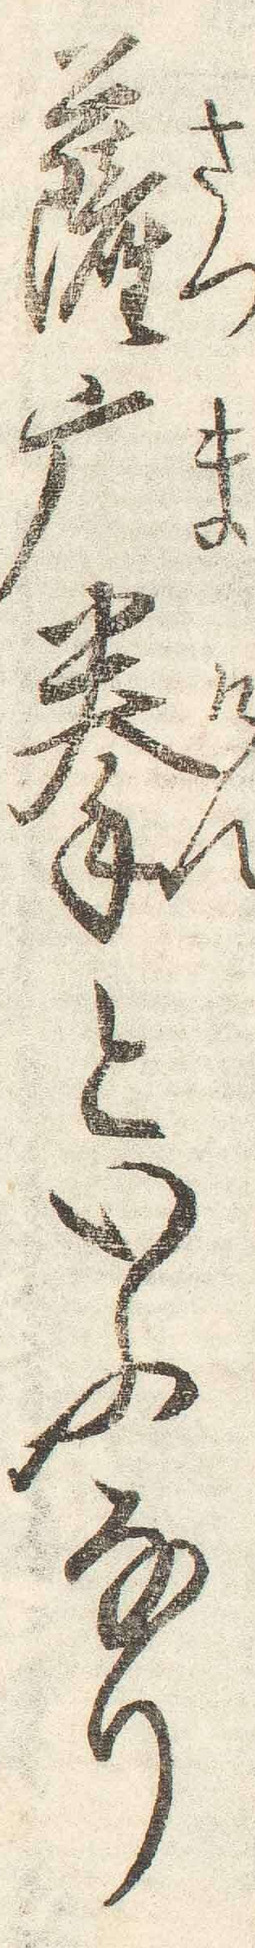薩摩拳といふなり
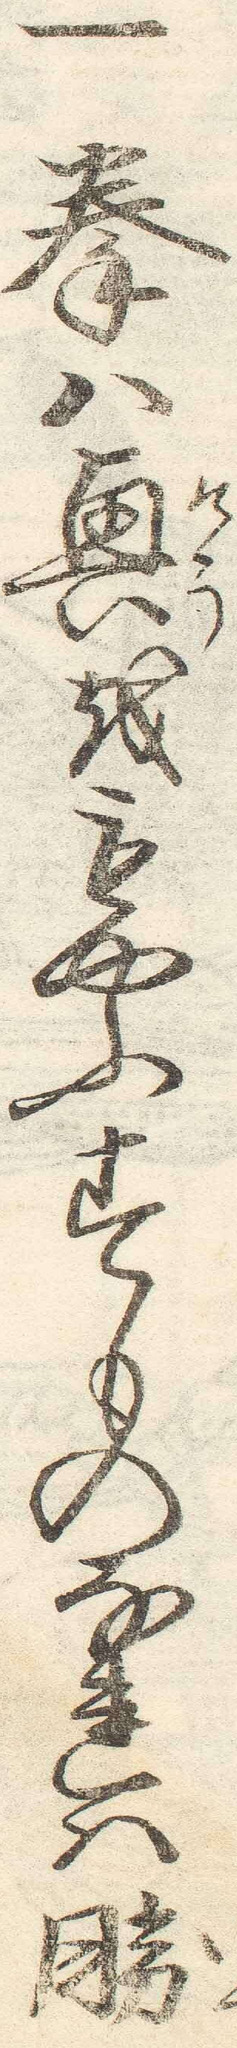一拳は興をもやうすものなれは勝
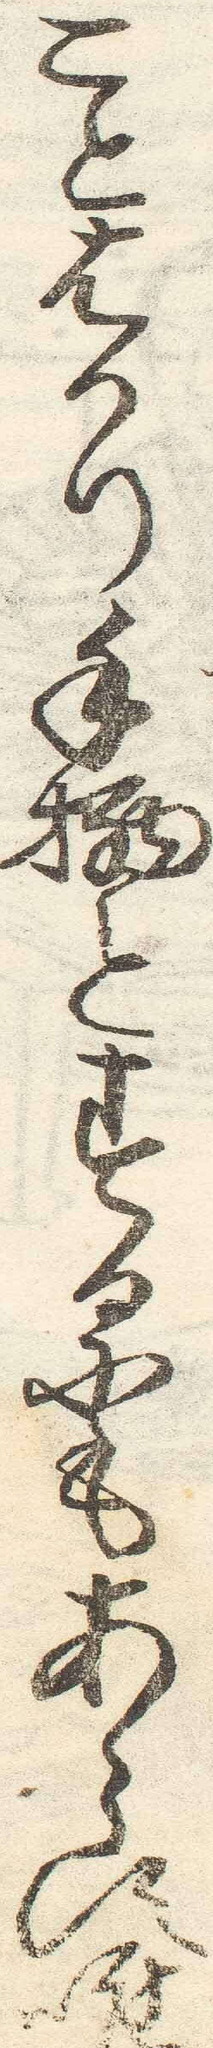ことはかり手柄とするにもあらす唯
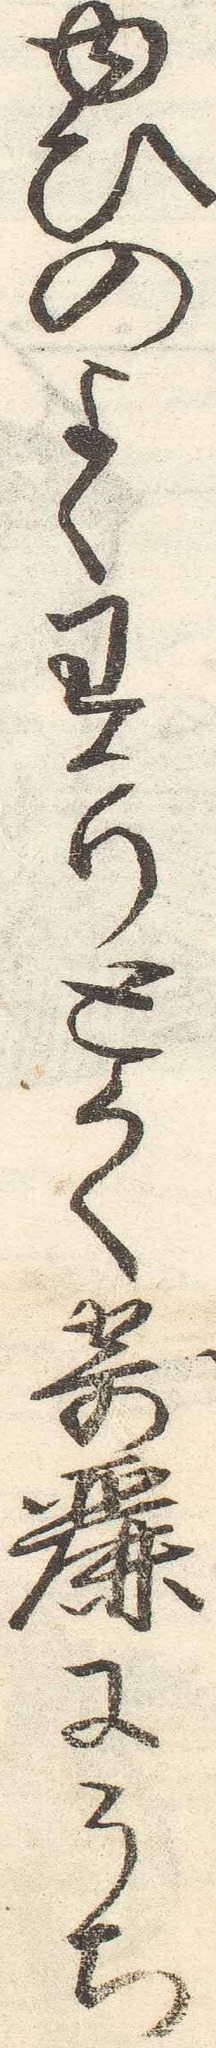ゆひのよくわかりとかく綺麗にうち
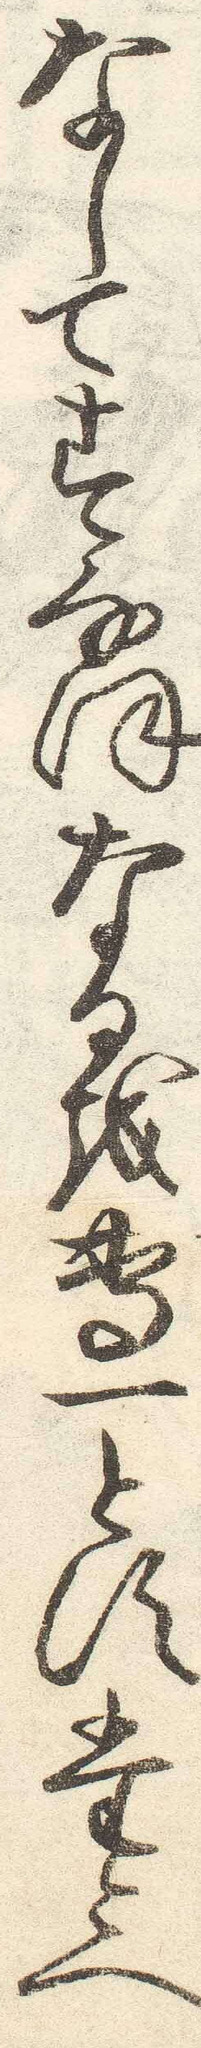なしてすなほなるを専一とすたとへ
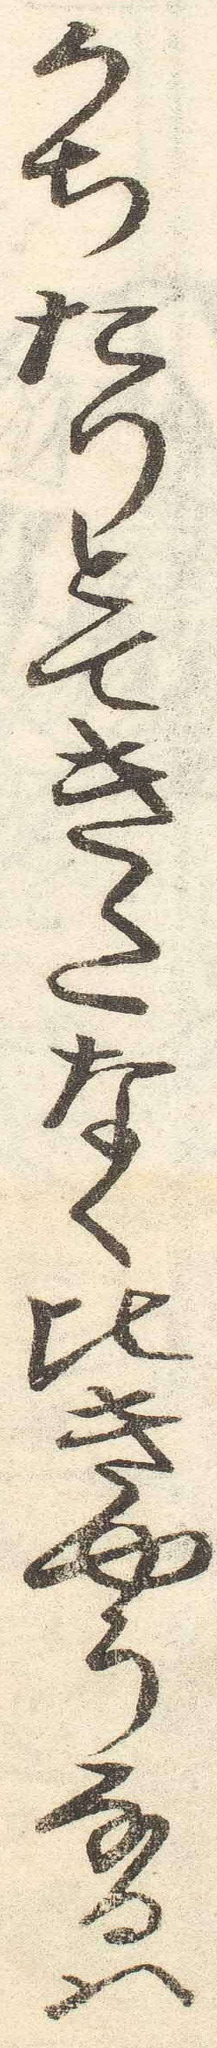うちたりとてきたなく比きやうなるは
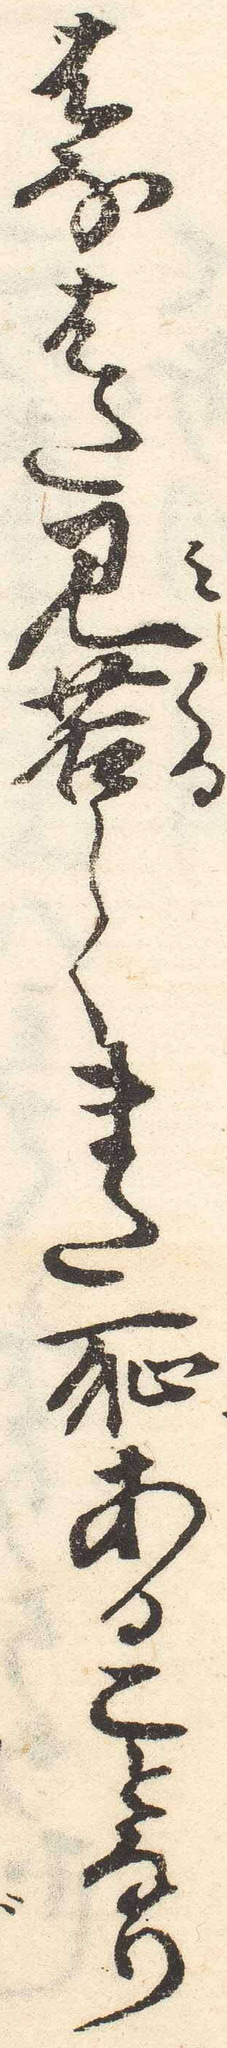はなはた見苦しくまた恥あることなり
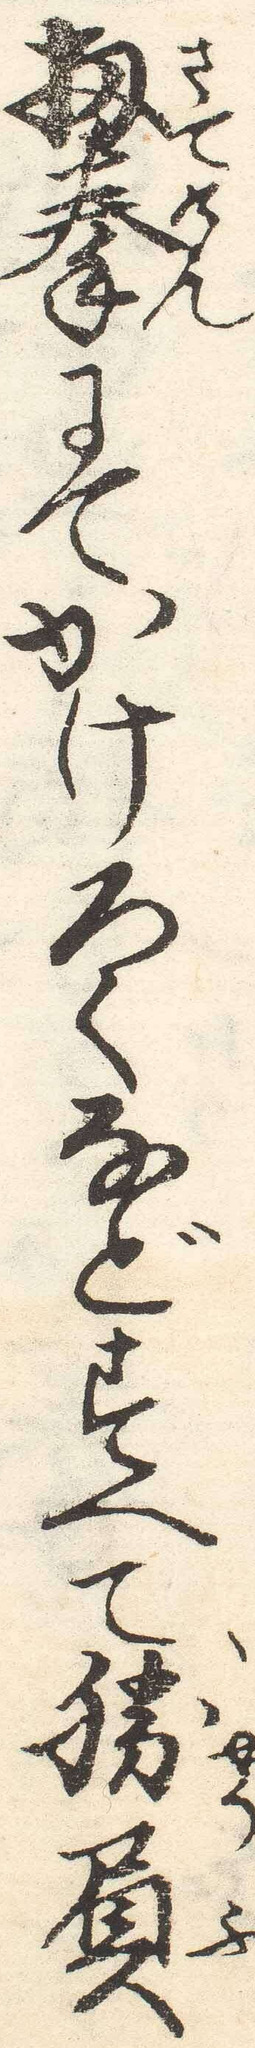扨拳にてかけろくろくなどすへて勝負
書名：拳独稽古
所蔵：東京学芸大学附属図書館 国文学研究資料館
